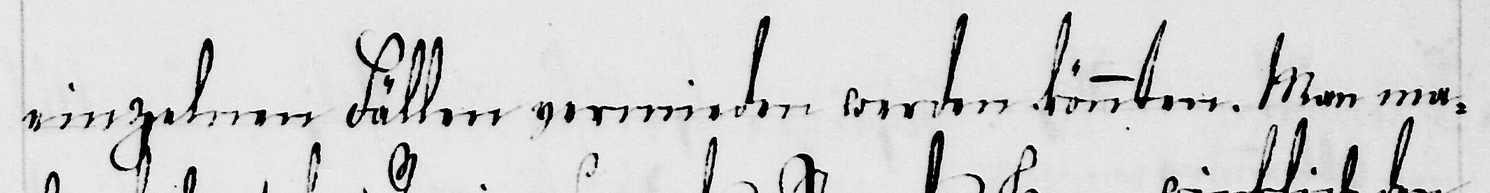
einzelnen Fällen vermieden werden könnten. Man ma¬
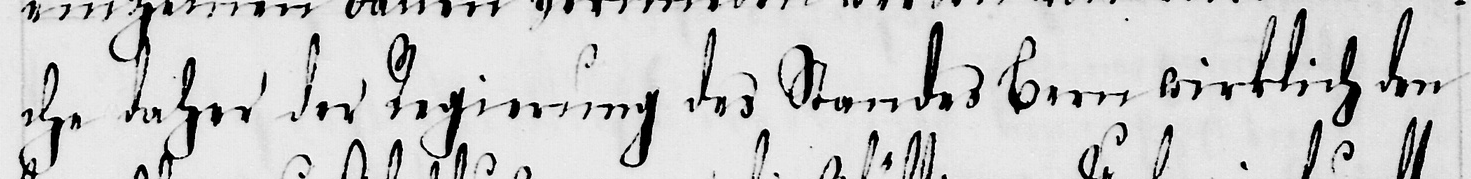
che daher der Regierung des Standes Bern wirklich den
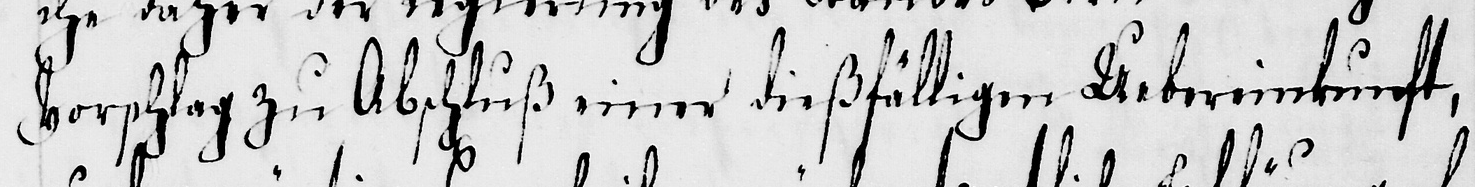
Vorschlag zu Abschluß einer dießfälligen Uebereinkunft,
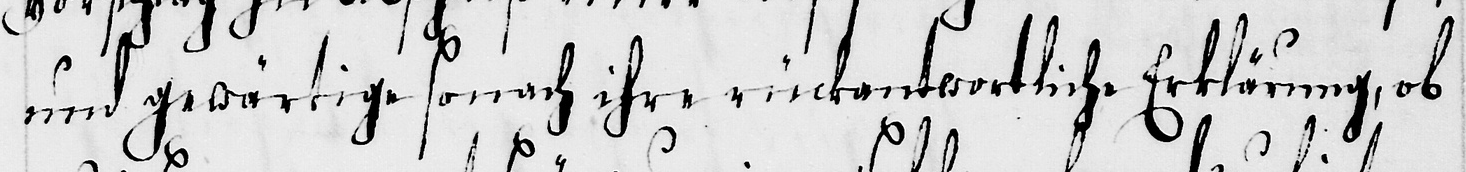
und gewärtige sonach ihre rückantwortliche Erklärung, ob
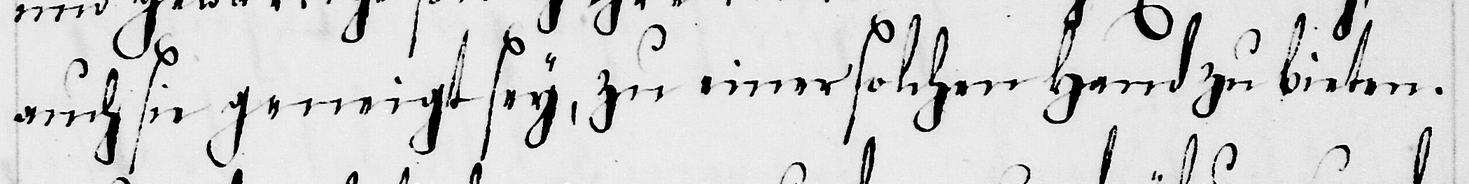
auch sie geneigt sey, zu einer solchen Hand zu bieten.
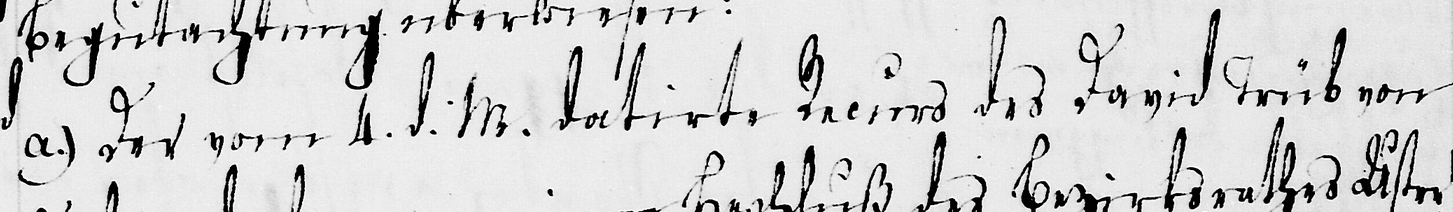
a.) Der vom 4. d. M. datirte Recurs des David Trüb von
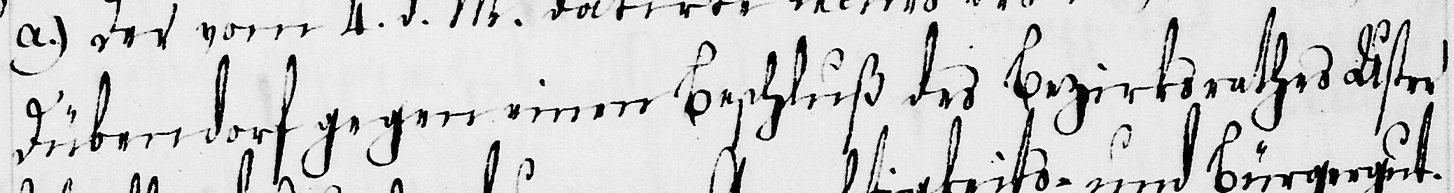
Dübendorf gegen einen Beschluß des Bezirksrathes Uster
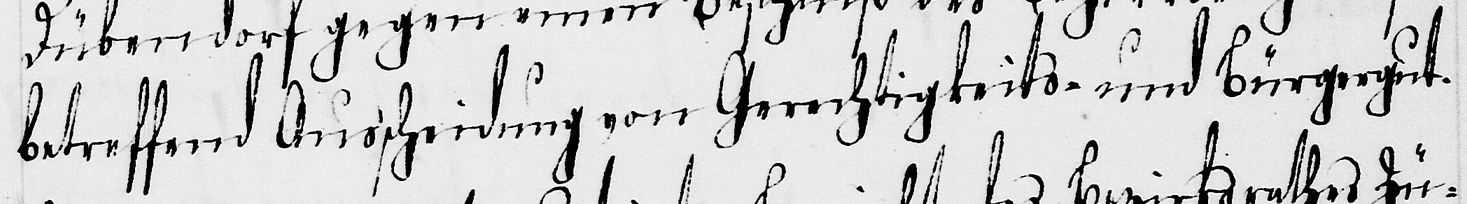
betreffend Ausscheidung von Gerechtigkeits- und Bürgergut.
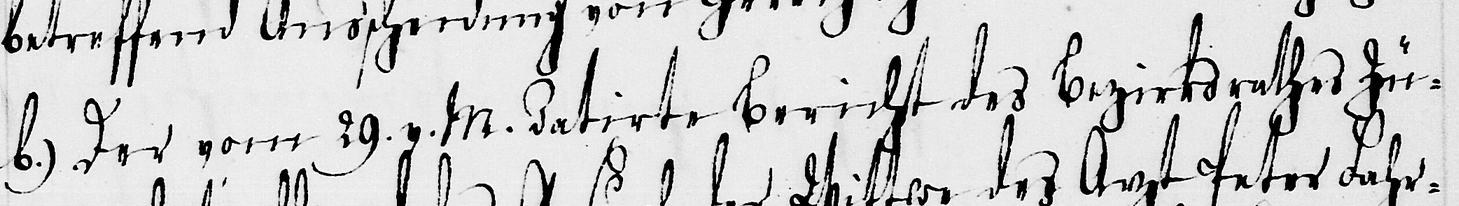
b.) Der vom 29. v. M. datirte Bericht des Bezirksrathes Zü¬
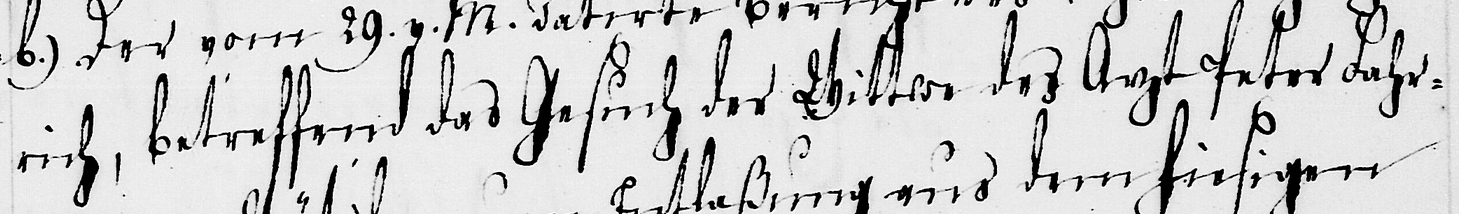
rich, betreffend des Gesuch der Wittwe des Arzt Peter Fahr¬
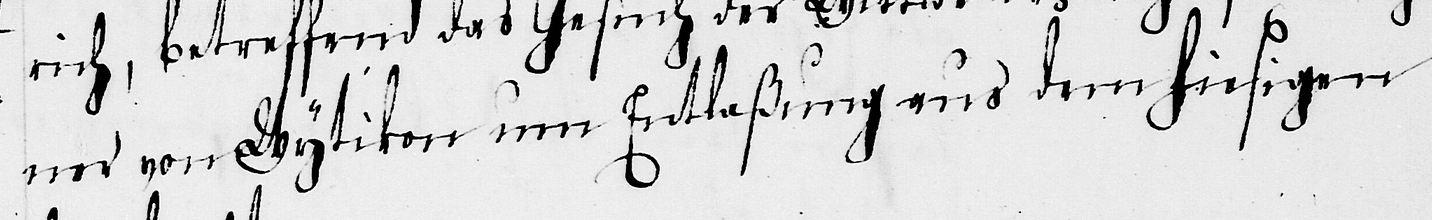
ner von Wytikon um Entlaßung aus dem hiesigen
